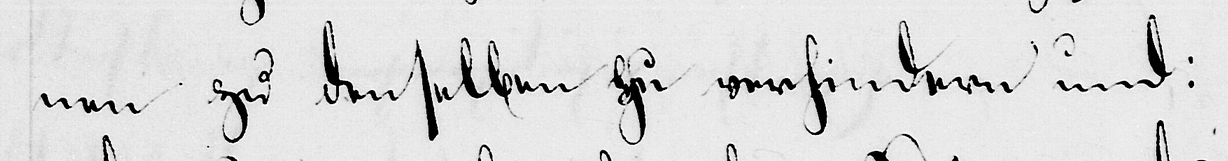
nen zu denselben zu verhindern und:
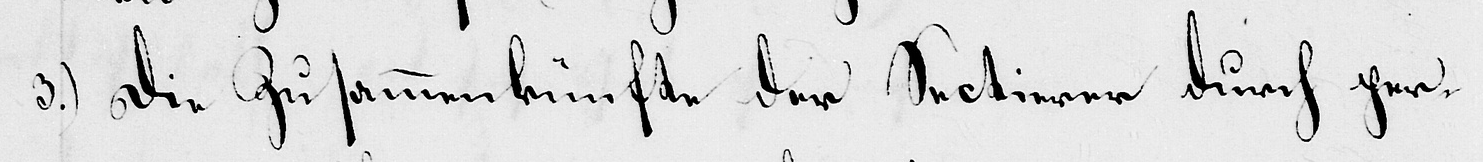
3.) Die Zusammenkünfte der Sectierer durch per¬
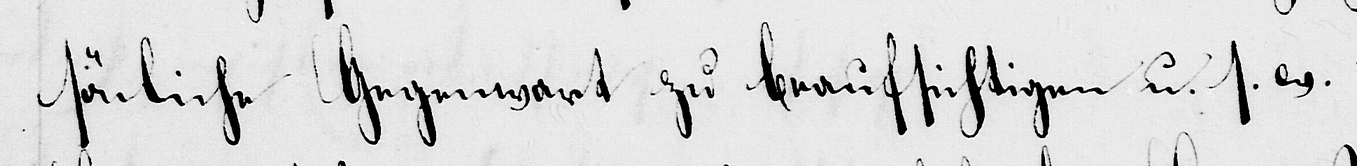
sönliche Gegenwart zu beaufsichtigen u. s. w.
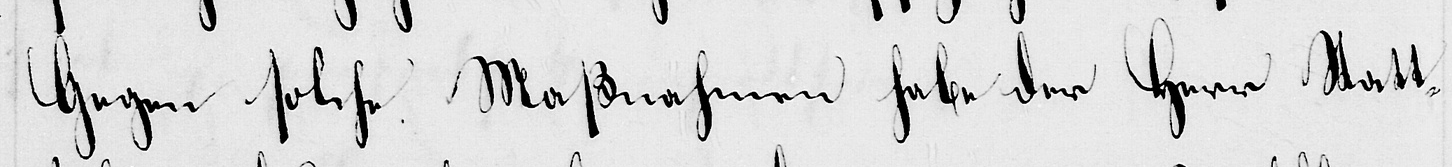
Gegen solche Maßnahmen habe der Herr Stat¬
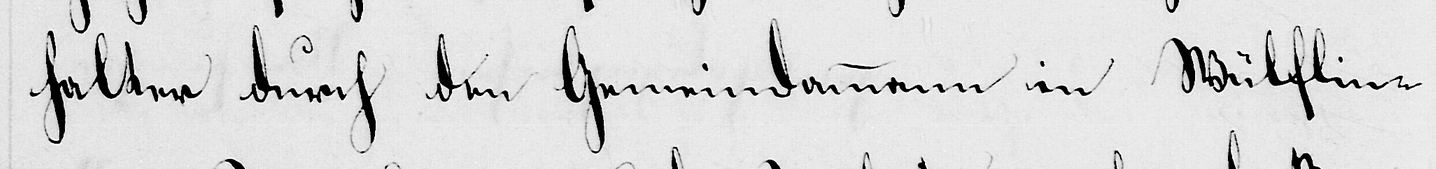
thalter durch den Gemeindammann in Wülflin¬
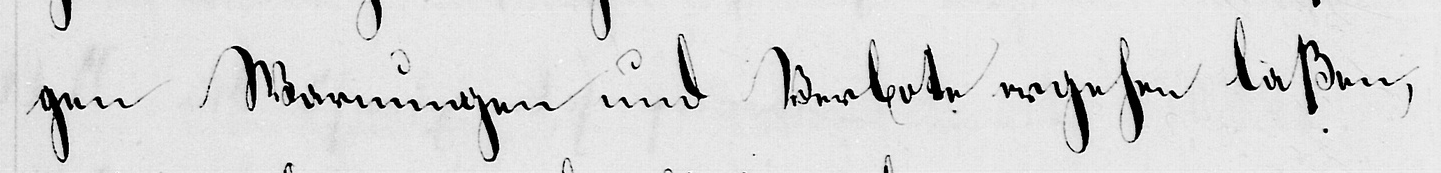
gen Warnungen und Verbote ergehen laßen,
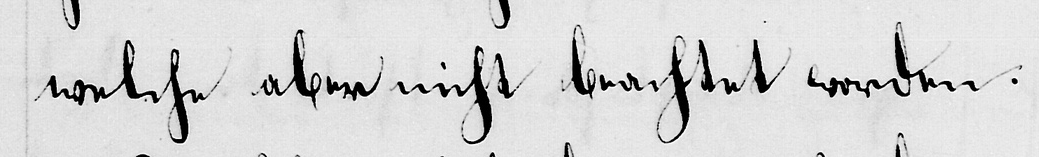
welche aber nicht beachtet worden.
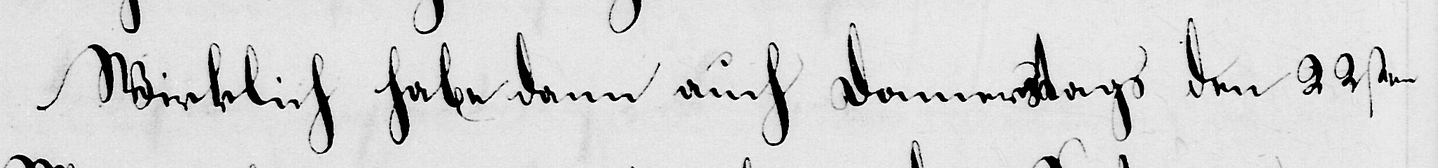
Wirklich habe dann auch Donnerstags den 22sten
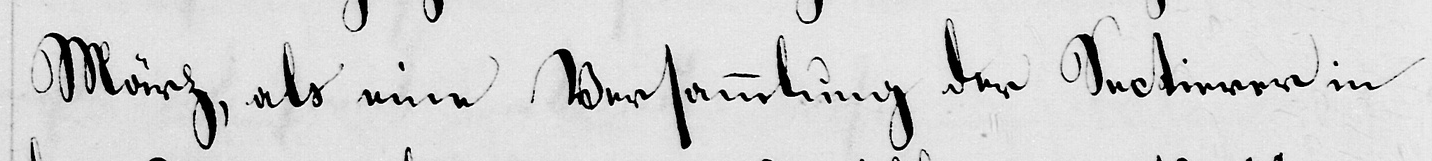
März, als eine Versammlung der Sectierer in
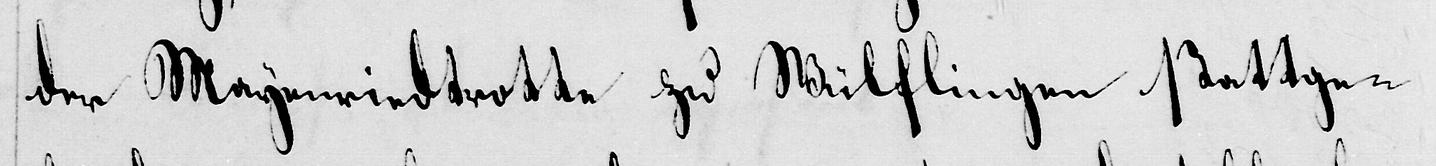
der Mayenriedtrotte zu Wülflingen stattge¬
